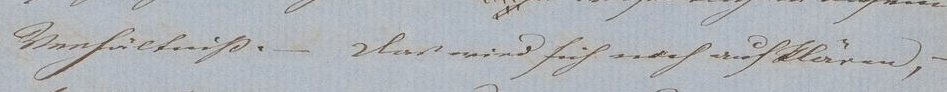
Verhältniß. – Das wird sich noch aufklären, –
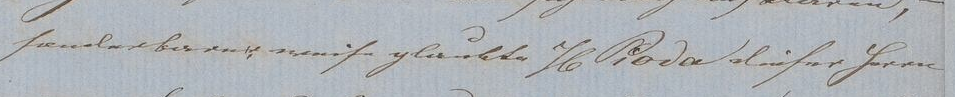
sonderbarerweise glaubte H Pioda dieser Herrn
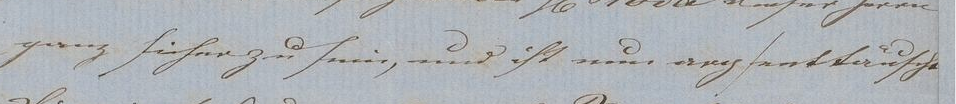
ganz sicher zu sein, und ist nun arg enttäuscht.
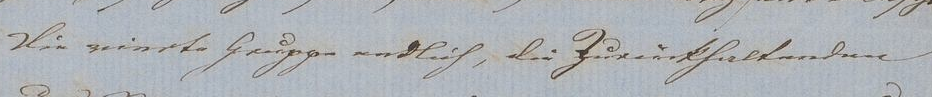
Die vierte Gruppe endlich, die Zurückhaltenden
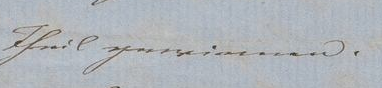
Theil gewinnen.
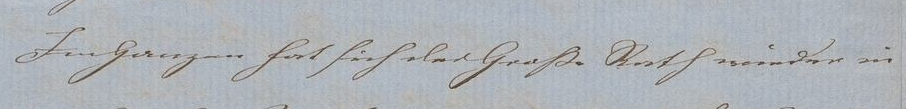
Im Ganzen hat sich der Große Rath wieder in
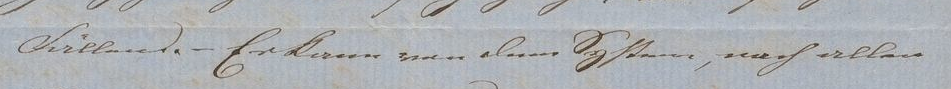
Fällen. – Er kann von dem System, nach allen
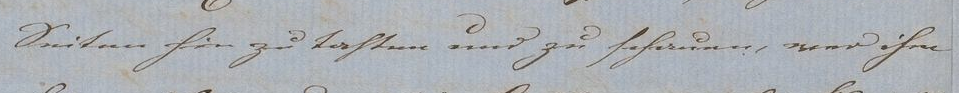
Seiten hin zu tasten und zu schauen, wer ihm
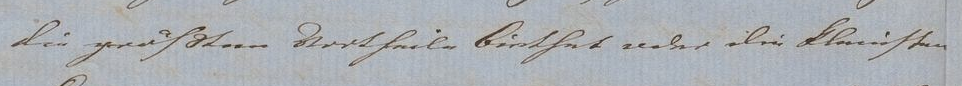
die größten Vortheile biethet oder die kleinsten
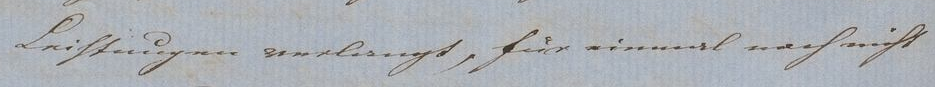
Leistungen verlangt, für einmal noch nicht
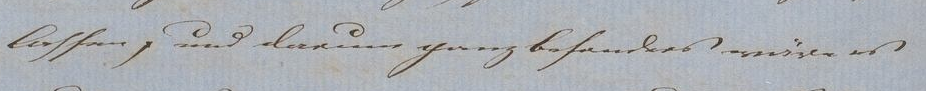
lassen, und darum ganz besonders wäre es
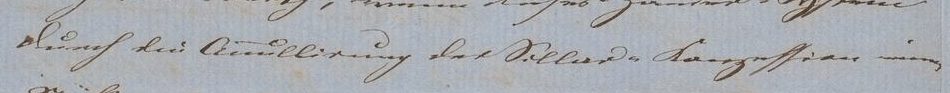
durch die Annullirung der Sillar-Konzession einen
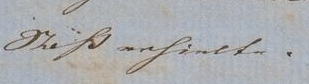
Stoß erhielte.
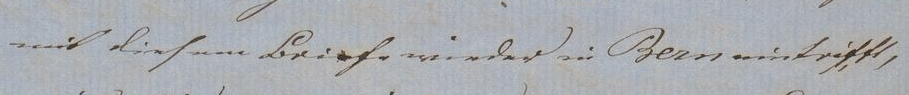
mit diesem Briefe wieder in Bern eintrifft,
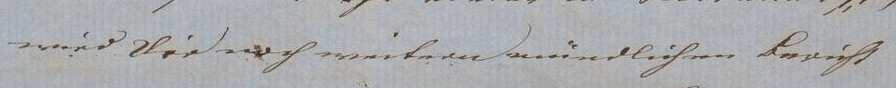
wird Dir noch weitern mündlichen Bericht
